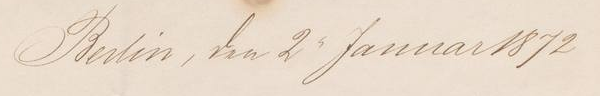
Berlin, den 2t Januar 1872
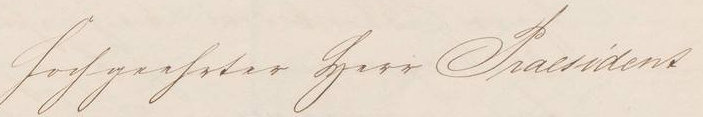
Hochgeehrter Herr Praesident
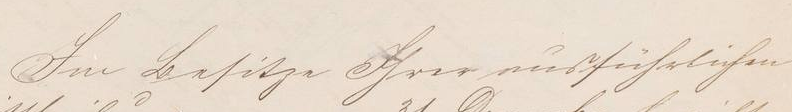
Im Besitze Ihrer ausführlichen
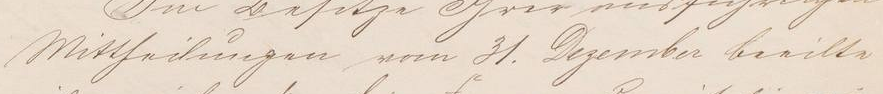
Mittheilungen vom 31. Dezember beeilte
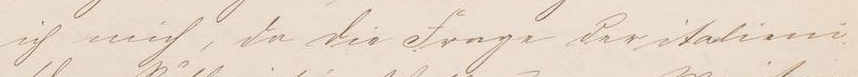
ich mich, da die Frage der italieni-
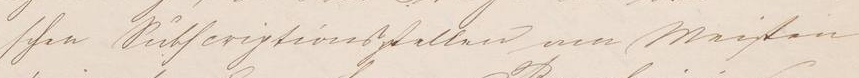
schen Subscriptionsstellen am Meisten
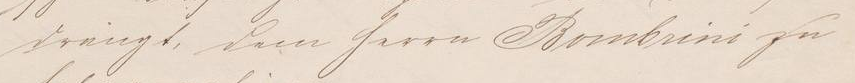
drängt, dem Herrn Bombrini zu
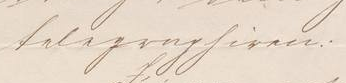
telegraphiren:
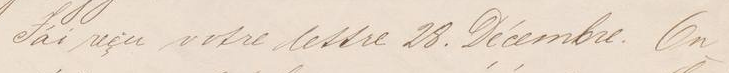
«J'ai reçu votre lettre 28. Décembre. On
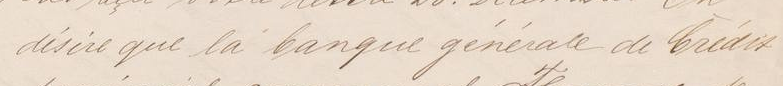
désire que la banque générale de Crédit
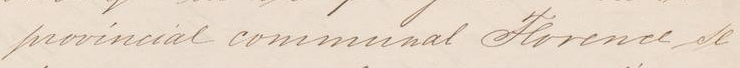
provincial communal Florence se
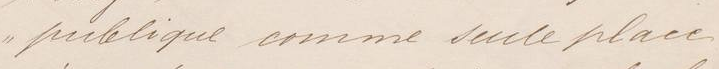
publique comme seule place
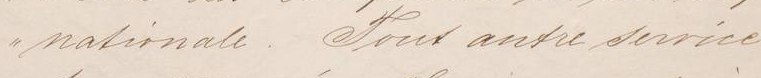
nationale. Tout autre service
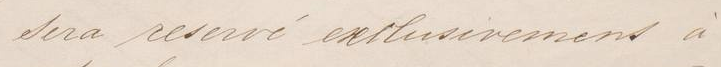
sera reservé exclusivement à
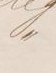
êtes
